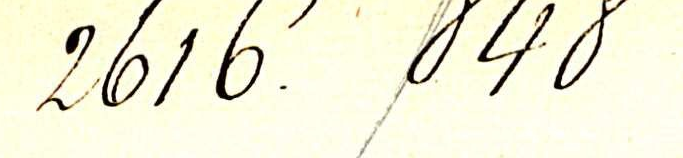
2616 [1]848
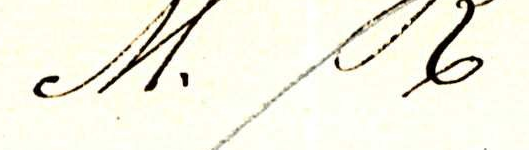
MR
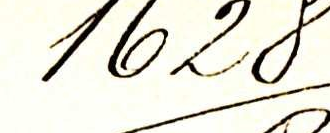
1628
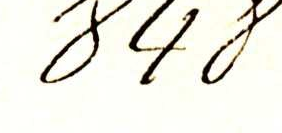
848
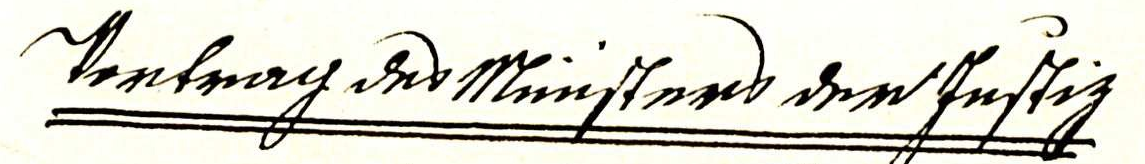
Vortrag des Ministers der Justiz
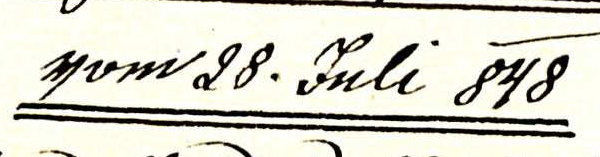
vom 28. Juli [1]848
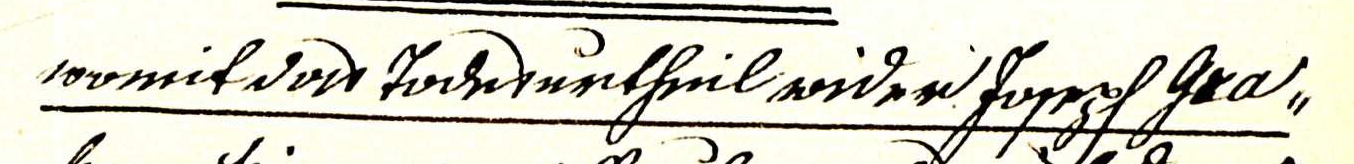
womit das Todesurtheil wider Joseph Gra¬
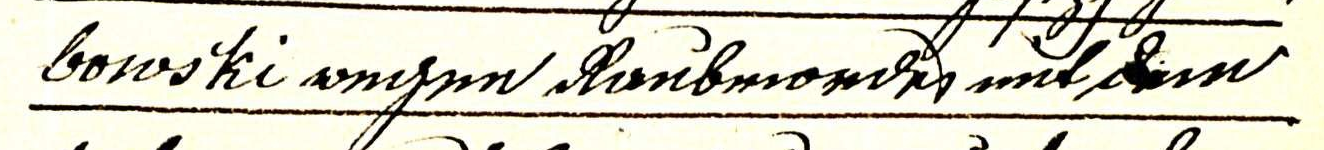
bowski wegen Raubmordes mit dem
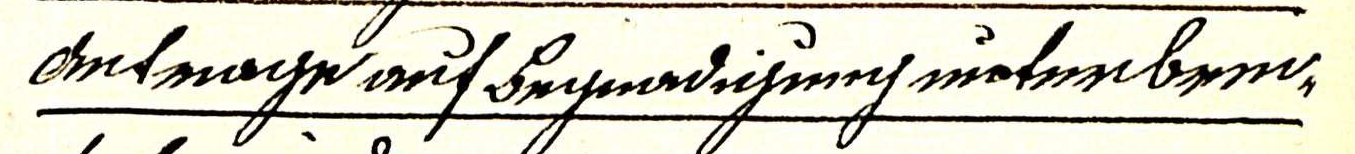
Antrage auf Begnadigung unterbrei-
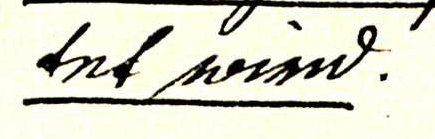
tet wird.
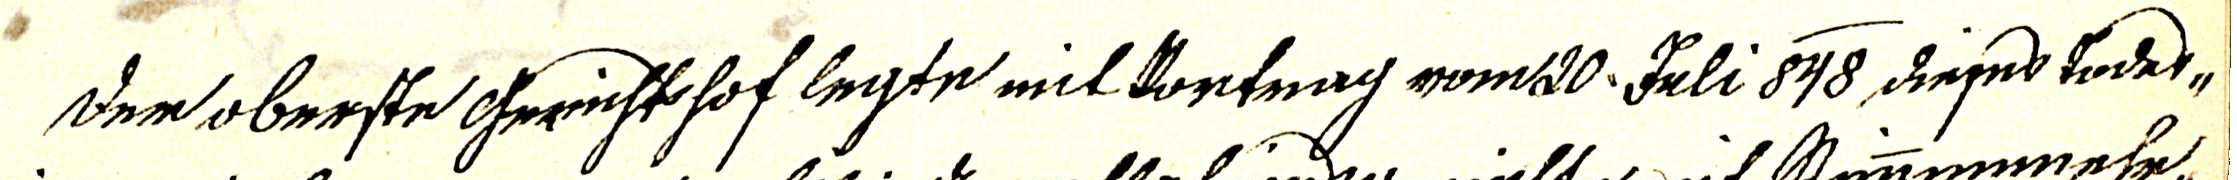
Der oberste Gerichtshof legte mit Vortrag vom 20. Juli [1]848 dieses Todes¬
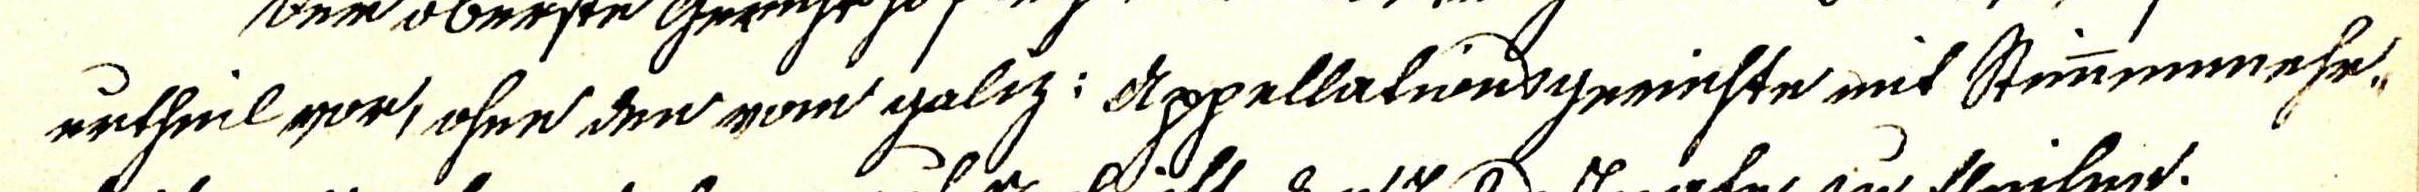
urtheil vor, ohne den vom galiz. Appellationsgerichte mit Simmenmehr¬
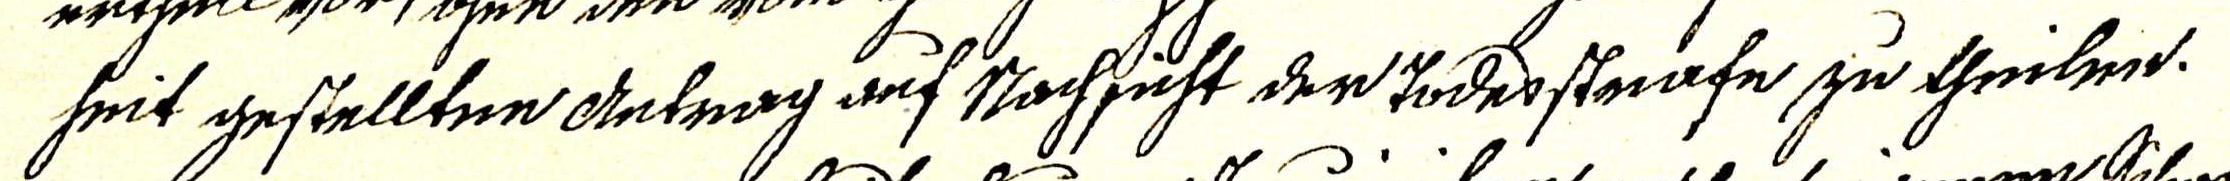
heit gestellten Antrag auf Nachsicht der Todesstrafe zu theilen.
